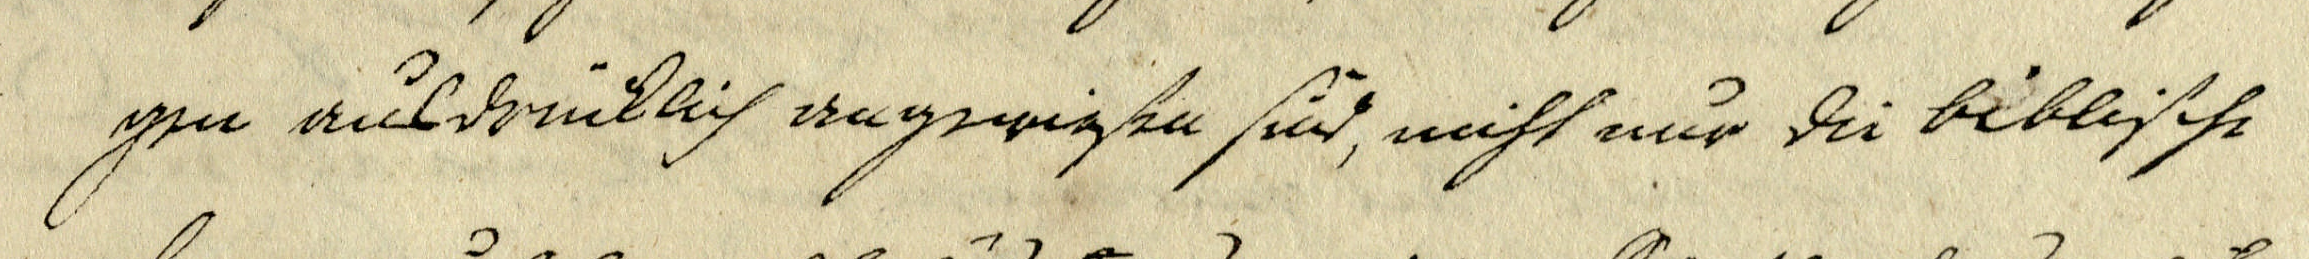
gen ausdrücklich angewiesen sind, nicht nur die biblische
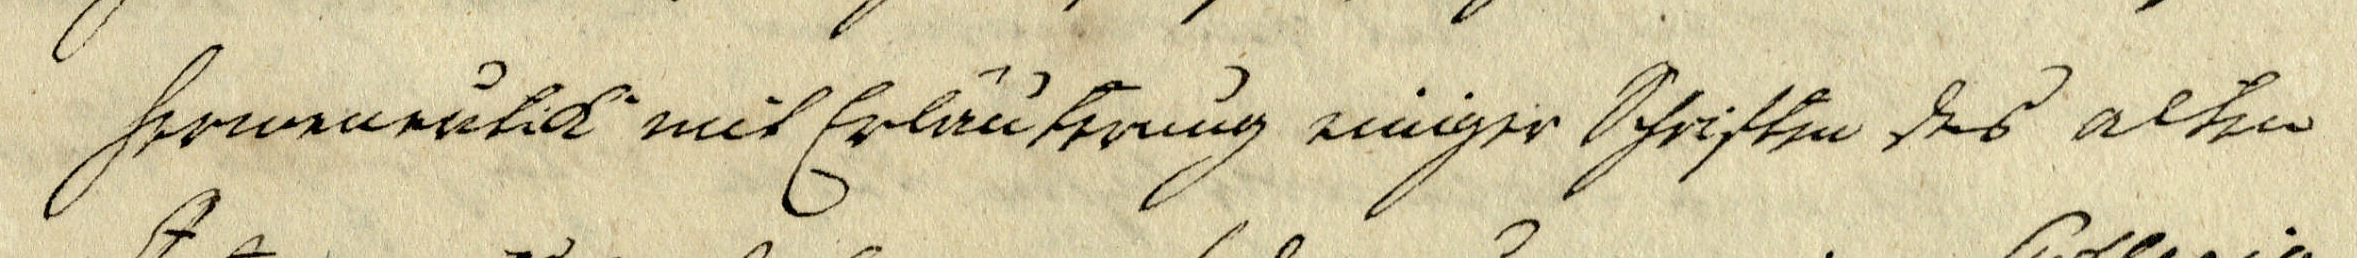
Hermeneutik mit Erläuterung einiger Schriften des alten
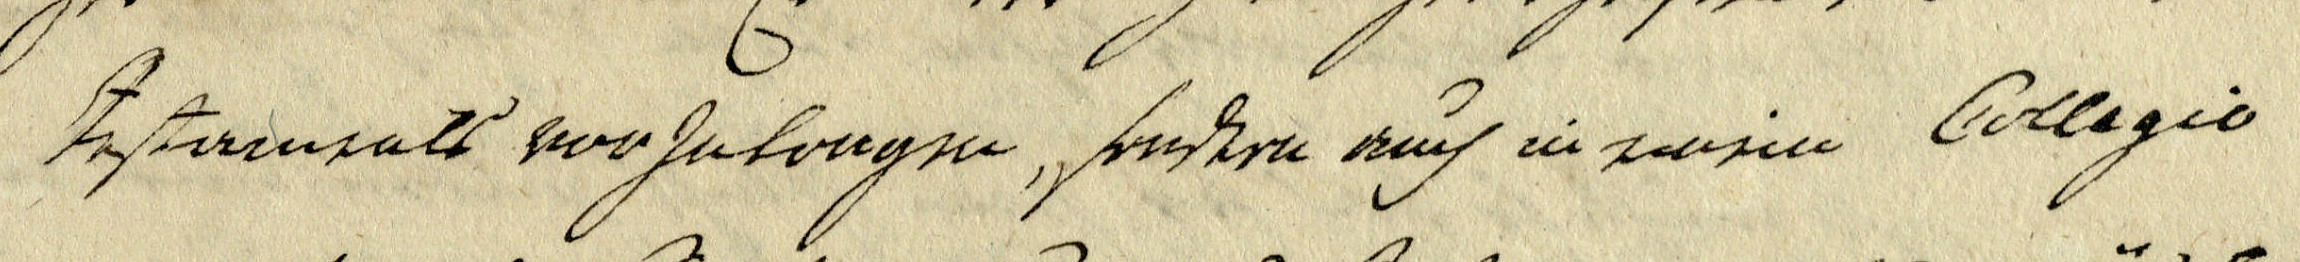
Testaments vorzutragen, sondern auch in einem Collegio
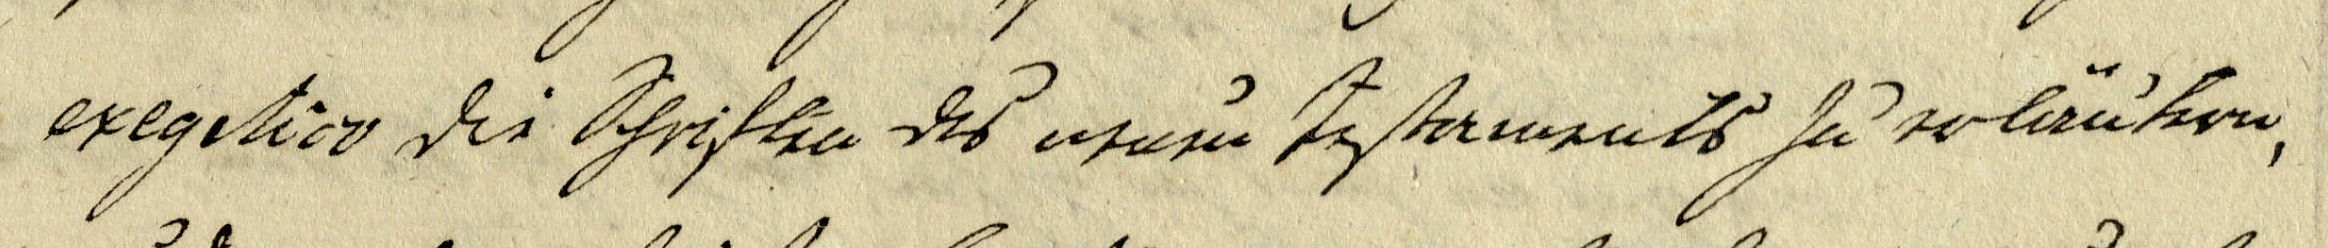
exegitico die Schriften des neuen Testaments zu erläutern,
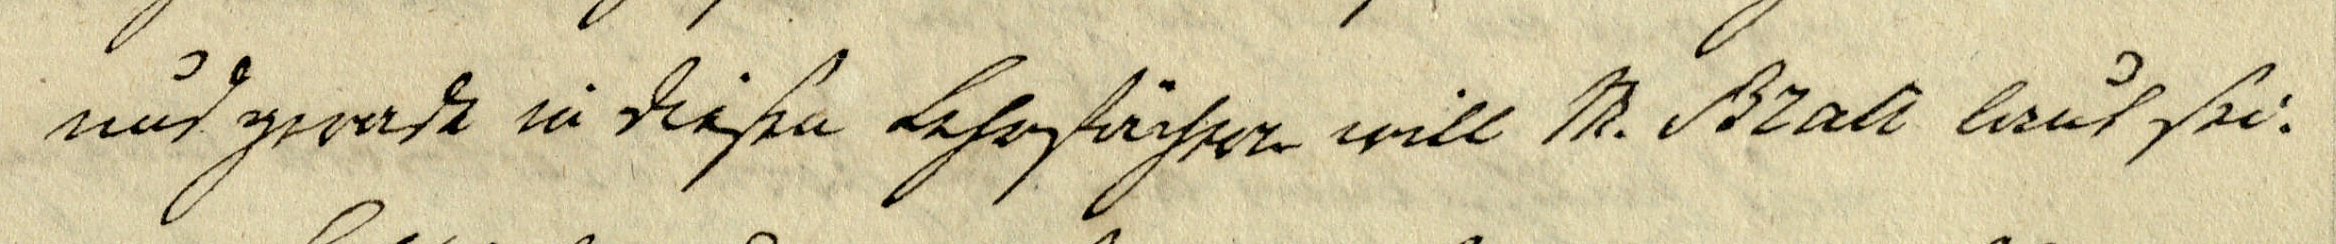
und gerade in diesen Lehrfächern will M. Bratt laut sei¬
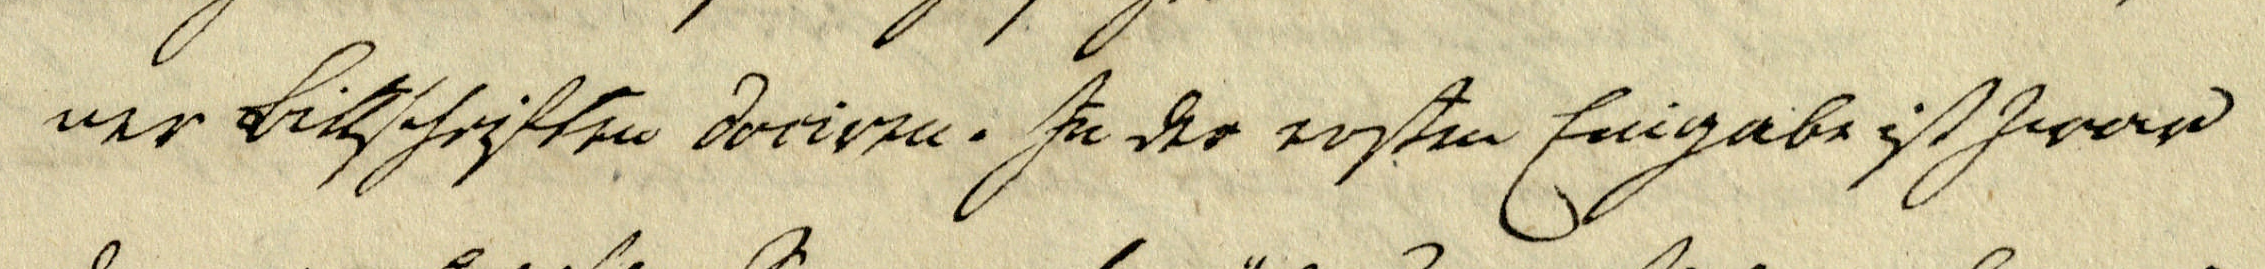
ner Bittschriften dociren. In der ersten Eingabe ist zwar
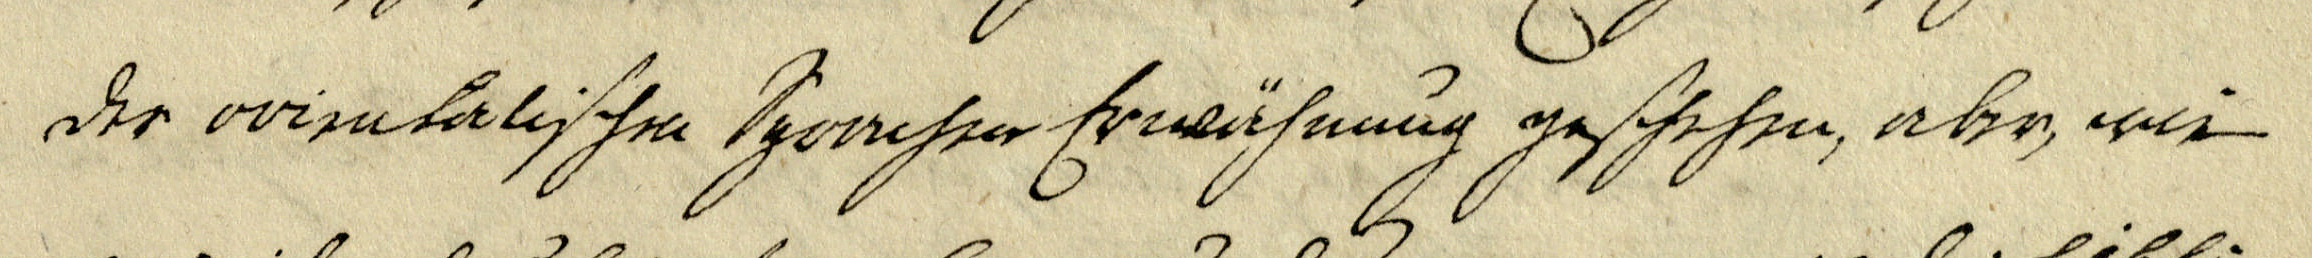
der orientalischen Sprachen Erwähnung geschehen, aber, wie
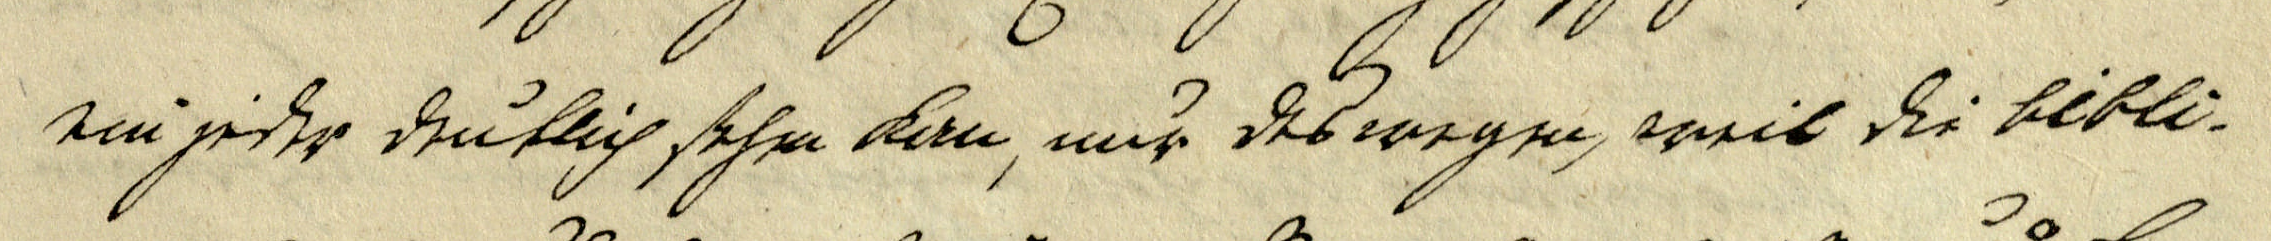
ein jeder deutlich sehen kan, nur deswegen, weil die bibli¬
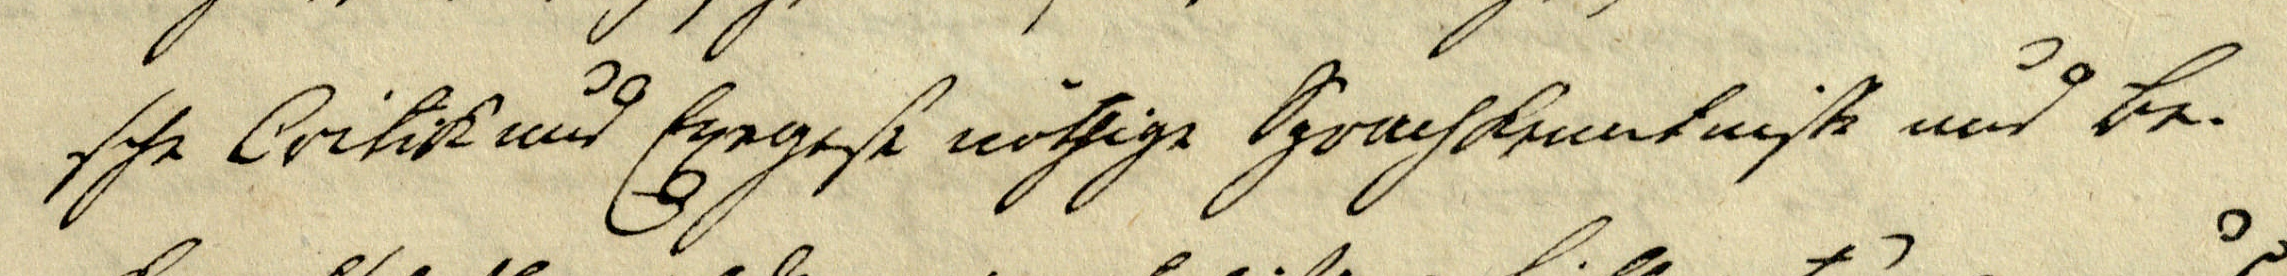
sche Critik und Exegese nöthige Sprachkenntnisse und Be¬
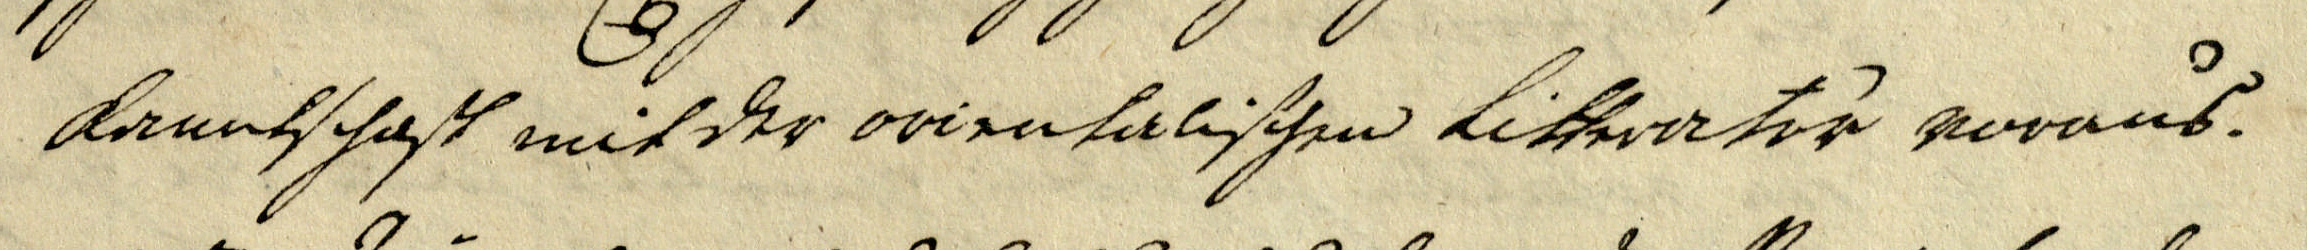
kanntschaft mit der orientalischen Litteratur voraus¬
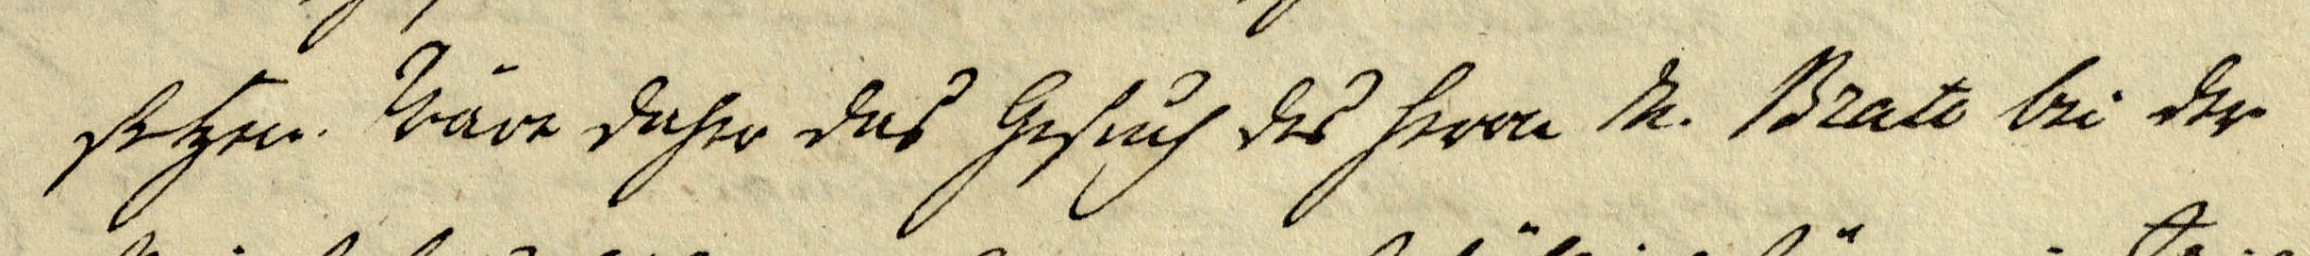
setzen. Wäre daher das Gesuch des Herrn M. Bratt bei der
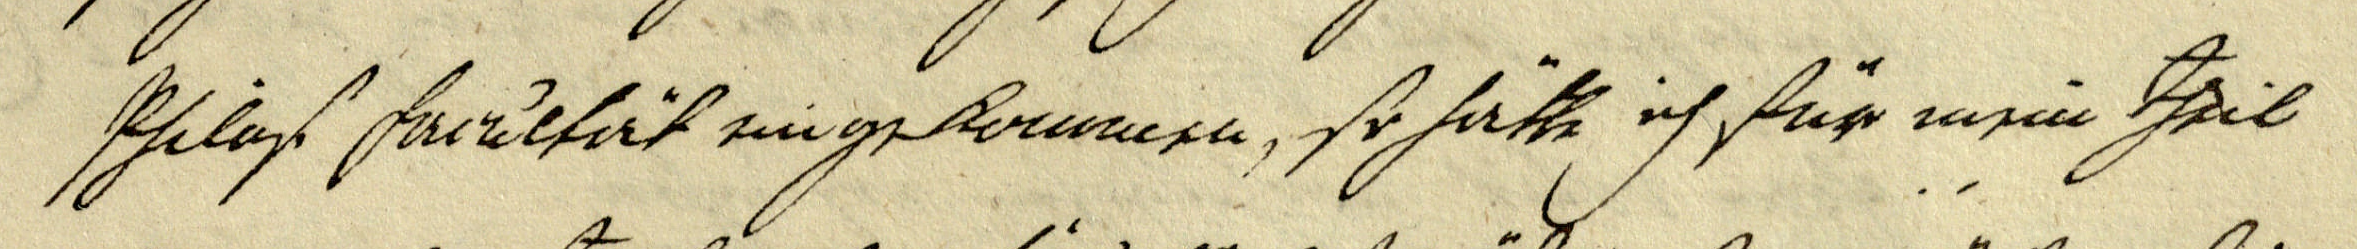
Philos. Facultät eingekommen, so hätte ich für mein Theil
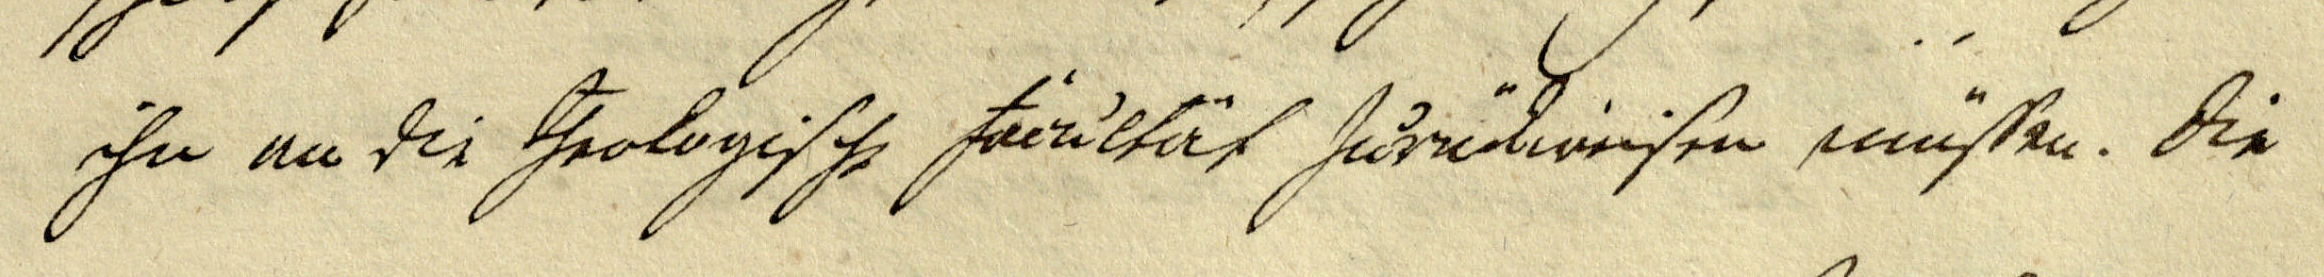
ihn an die Theologische Facultät zurückweisen müssen. Die
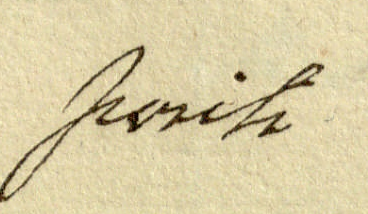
zweite
